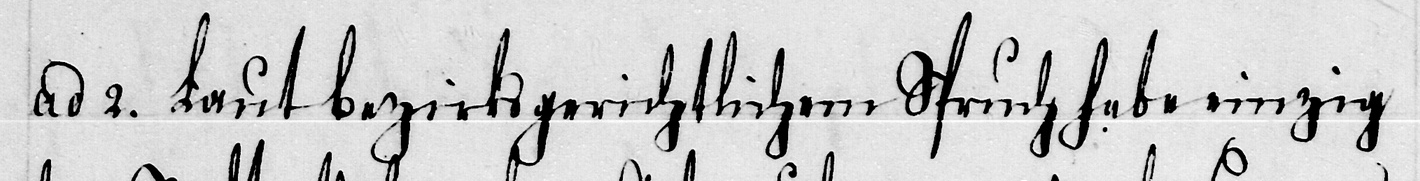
ad 2. Laut bezirksgerichtlichem Spruch habe einzig
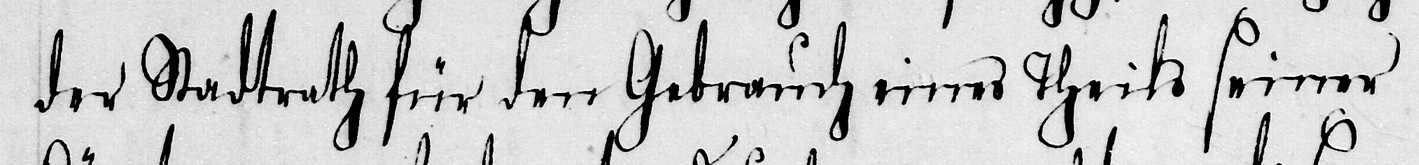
der Stadtrath für den Gebrauch eines Theils seiner
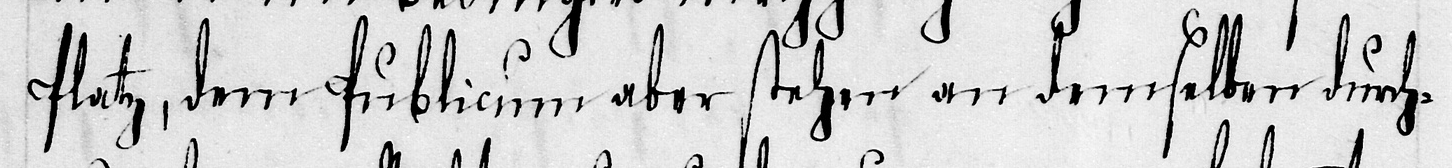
Platz, dem Publicum aber stehen an demselben durc¬
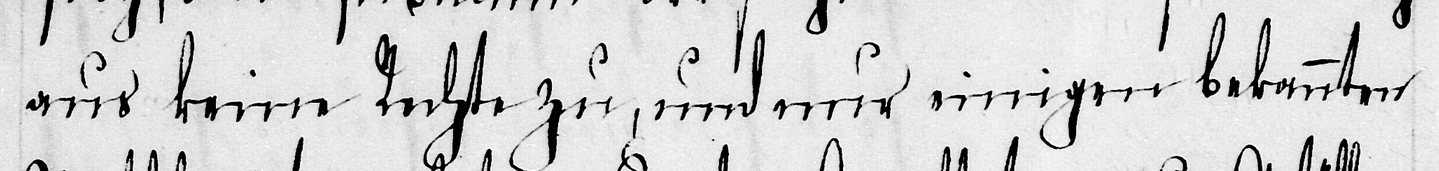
haus keine Rechte zu, und nur einigen bekannten
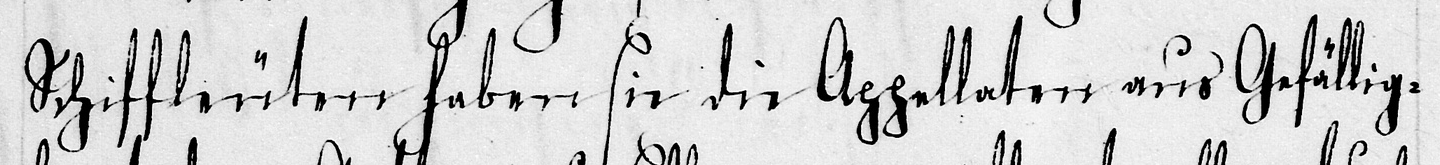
Schiffleuten haben sie die Appellaten aus Gefälli¬
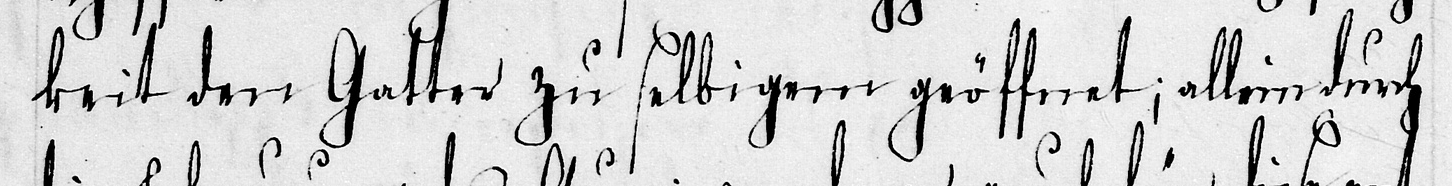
gkeit den Gatter zu selbigem geöffnet; allein durch
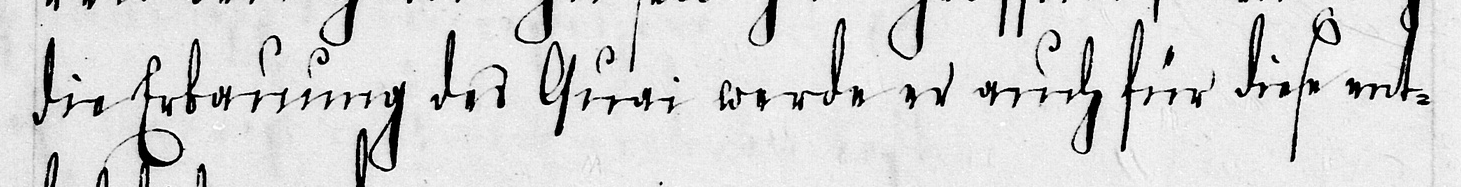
die Erbauung des Quai werde er auch für diese ent¬
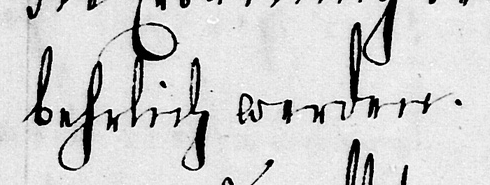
behrlich werden.
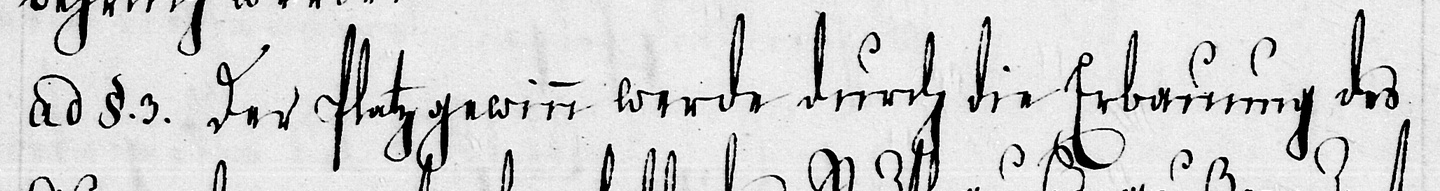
§. 3. Der Platzgewinn werde durch die Erbauung des
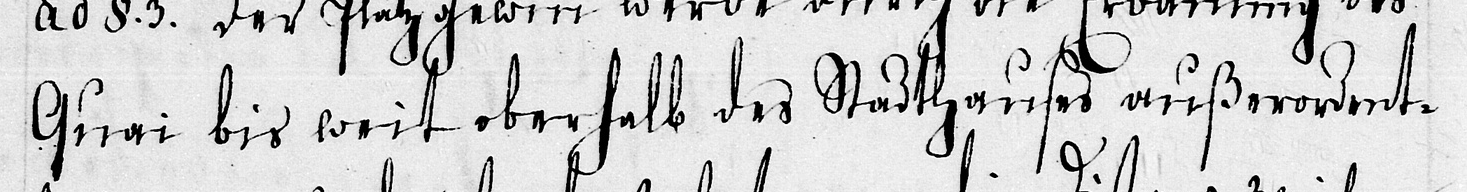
Quai bis weit oberhalb des Stadthauses außerordent¬
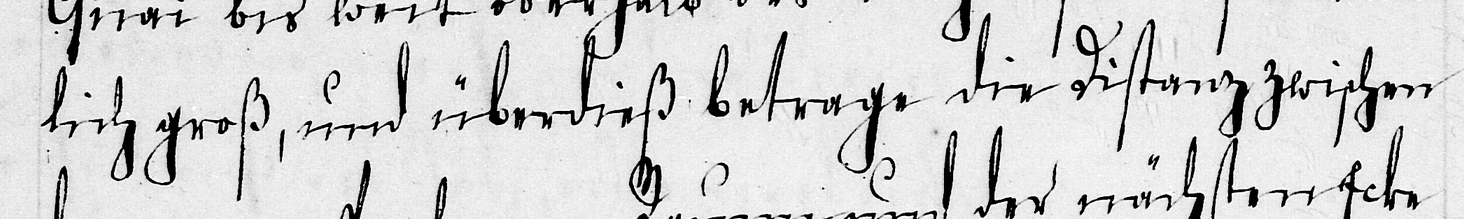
lich groß, und überdieß betrage die Distanz zwischen
